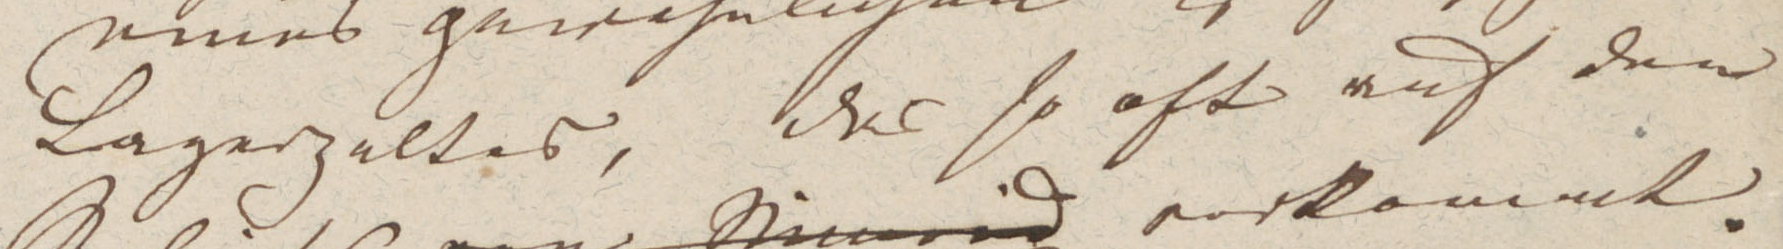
Lagerzeltes, das so oft auf den
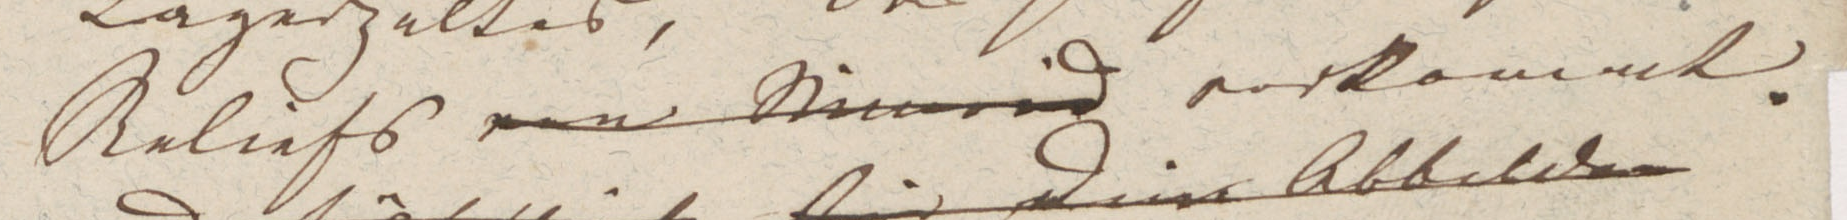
Reliefs von Nimrud vorkommt.
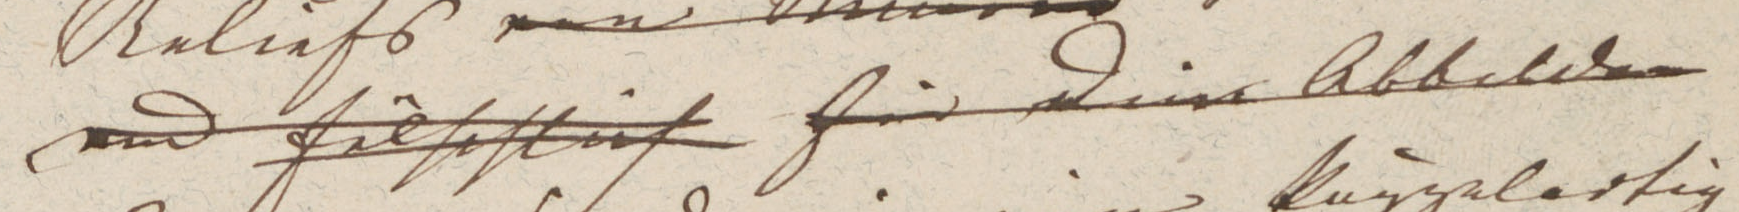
und fälschlich für Abbildun
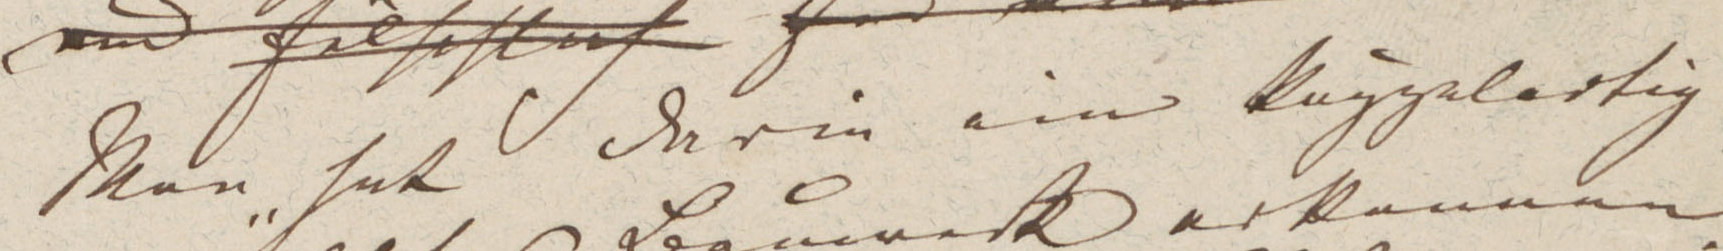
Man hat darin ein kuppelartig
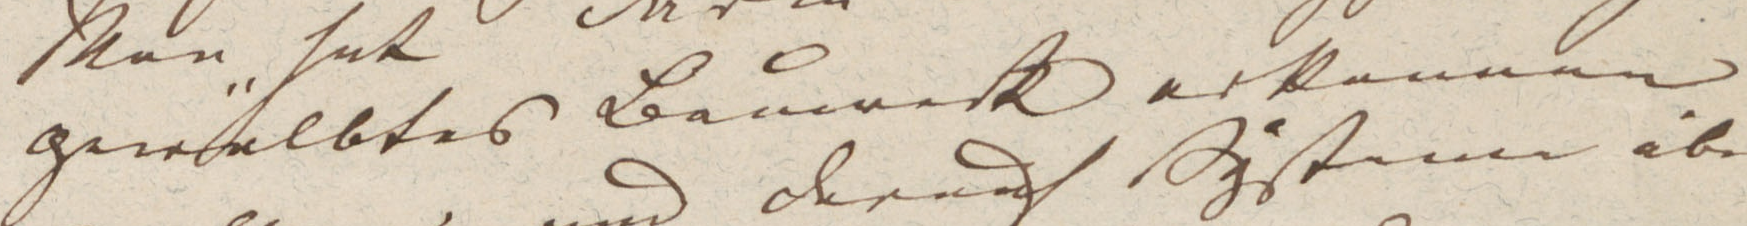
gewölbtes Bauwerk erkennen
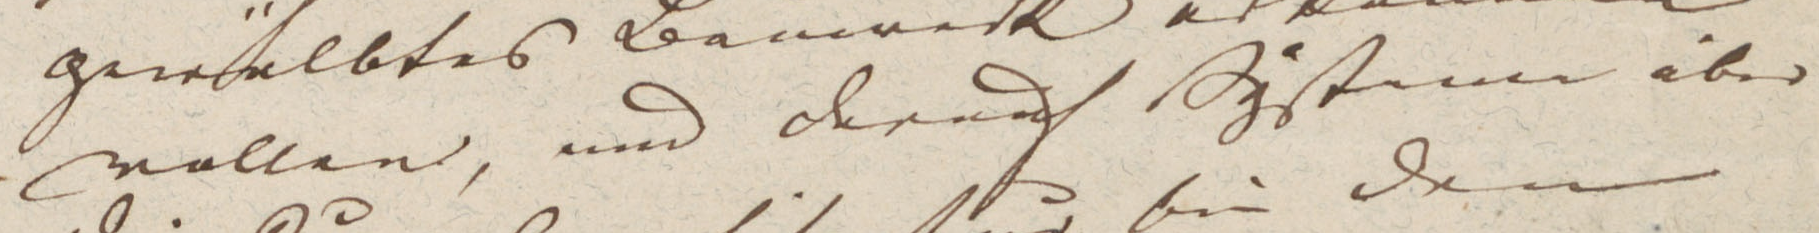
wollen, und darauf Systeme über
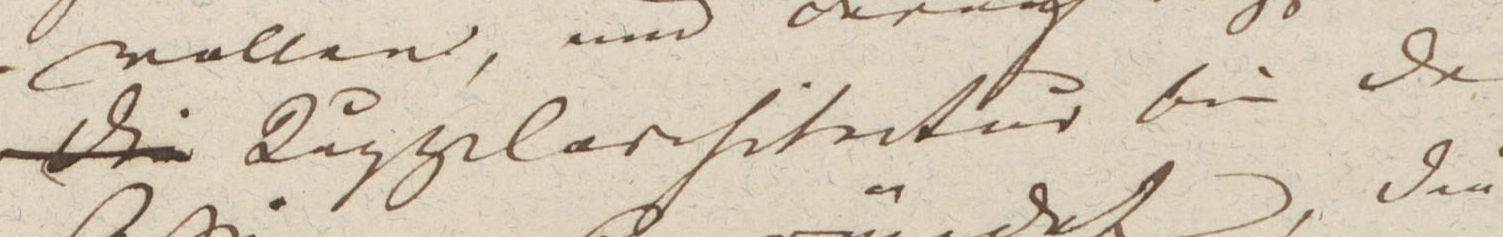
die Kuppelarchitectur bei den
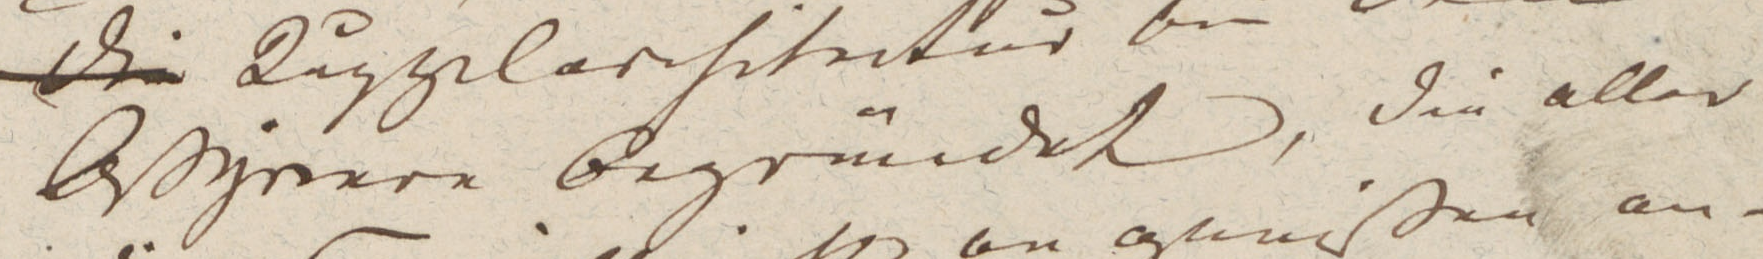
Assyrern begründet, die aller-
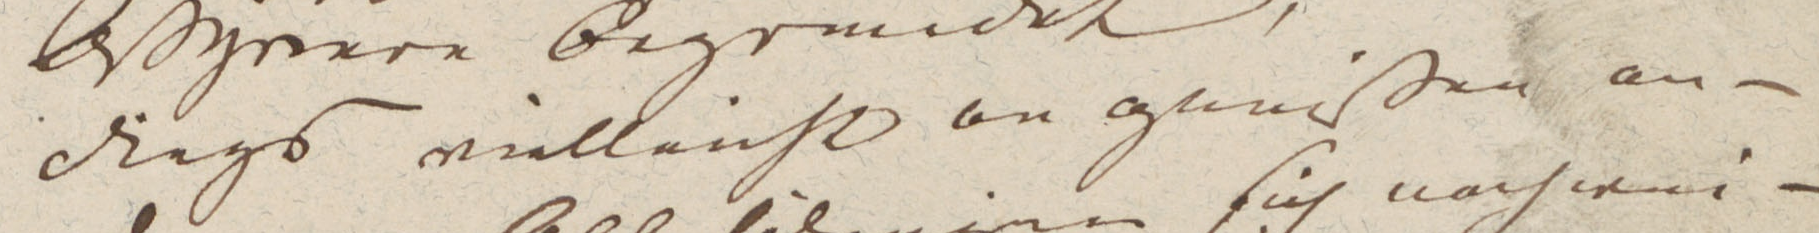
dings vielleicht an gewissen an-
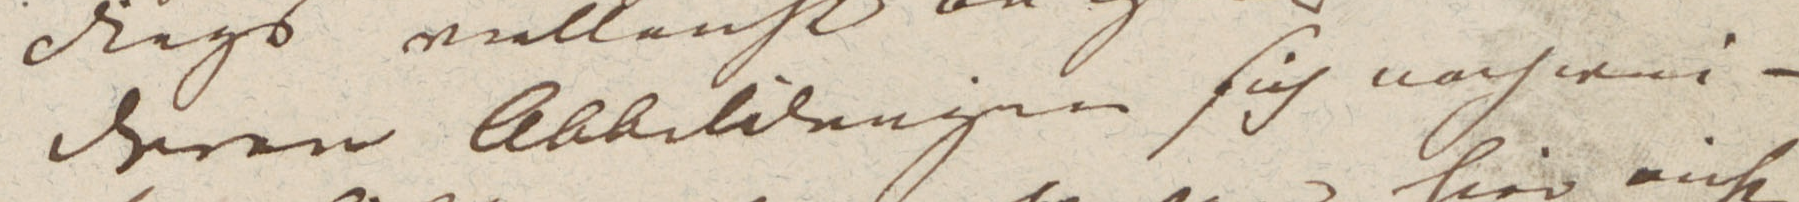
deren Abbildungen sich nachwei-
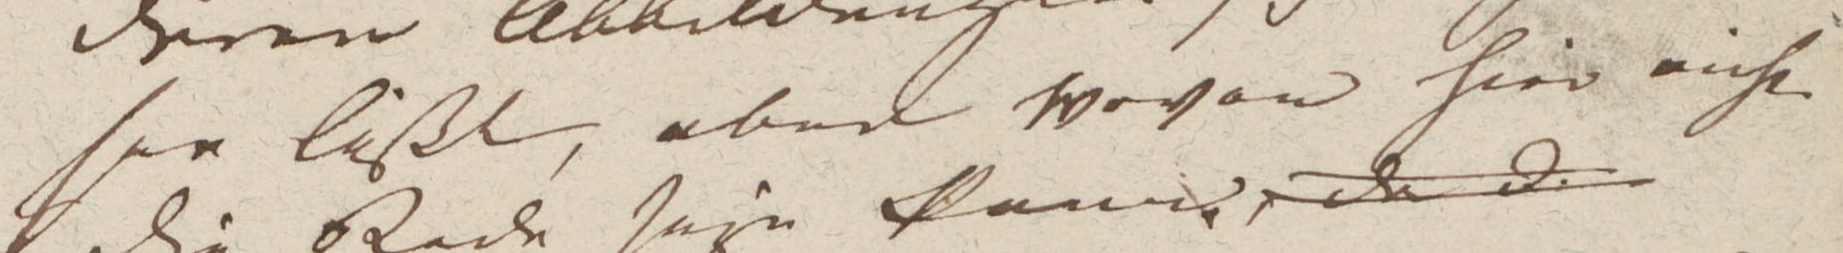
sen lässt, aber wovon hier nicht
